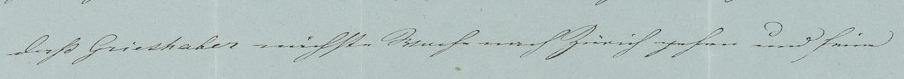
daß Grieshaber nächste Woche nach Zürich gehen und seine
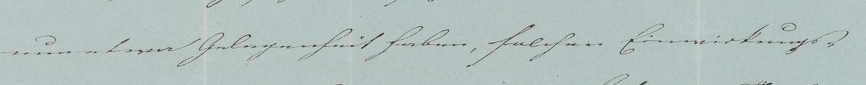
nun etwa Gelegenheit haben, solchen Einwirkungs-
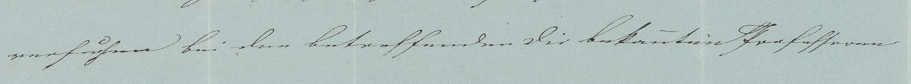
versuchen bei den betreffenden dir bekannten Professoren
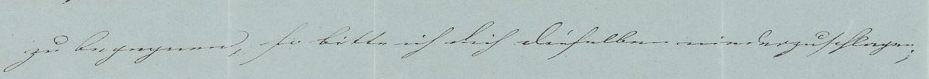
zu begegnen, so bitte ich dich dieselben niederzuschlagen;
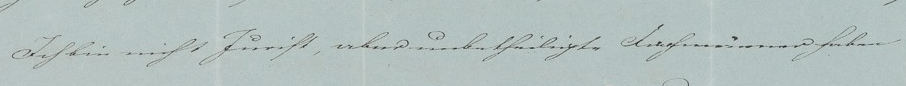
Ich bin nich Jurist, aber unbetheiligte Fachmänner haben
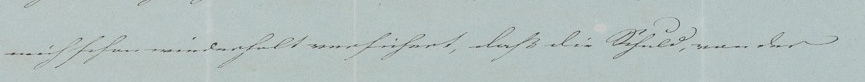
mich schon wiederholt versichert, daß die Schuld, von der
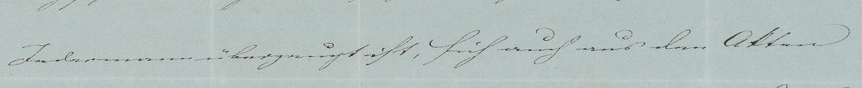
Jedermann überzeugt ist, sich auch aus den Akten
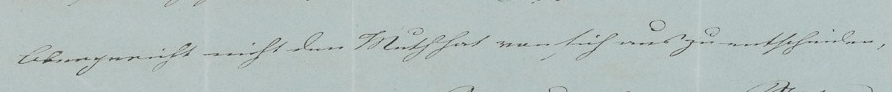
Obergericht nicht den Muth hat von sich aus zu entscheiden,
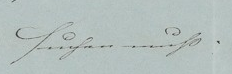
suchen muß.
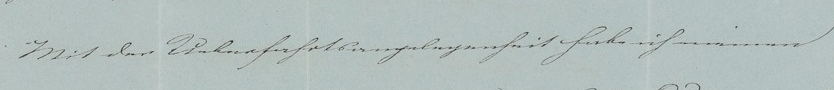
Mit der Ueberfahrtsangelegenheit habe ich meinen
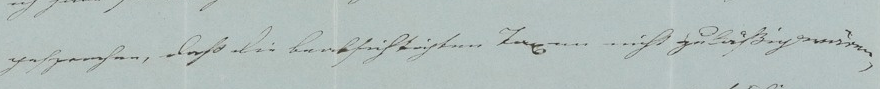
gesprochen, daß die beabsichtigten Taxen nicht zuläßig wären,
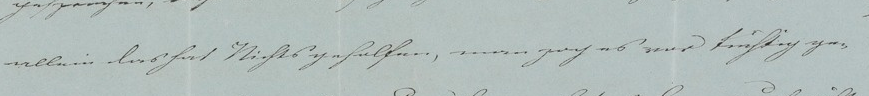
allein das hat Nichts geholfen, man zog es vor tüchtig ge-
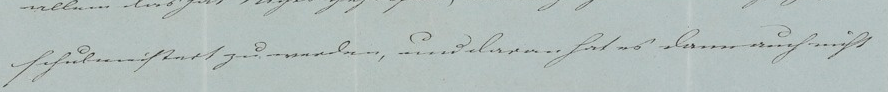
schulmeistert zu werden, und daran hat es dann auch nicht
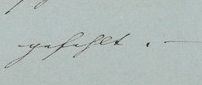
gefehlt. –
